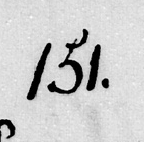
stel¬
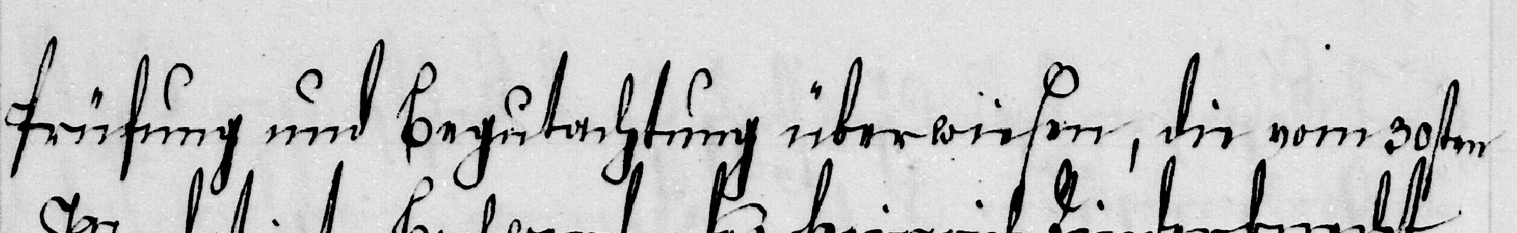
Prüfung und Begutachtung überwiesen, die vom 30sten
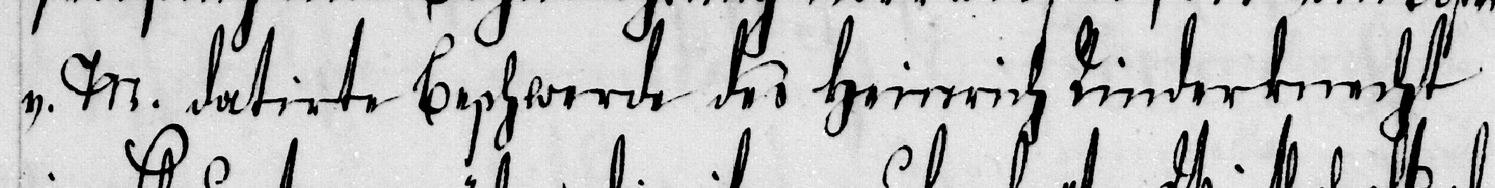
v. M. datirte Beschwerde des Heinrich Rinderknecht
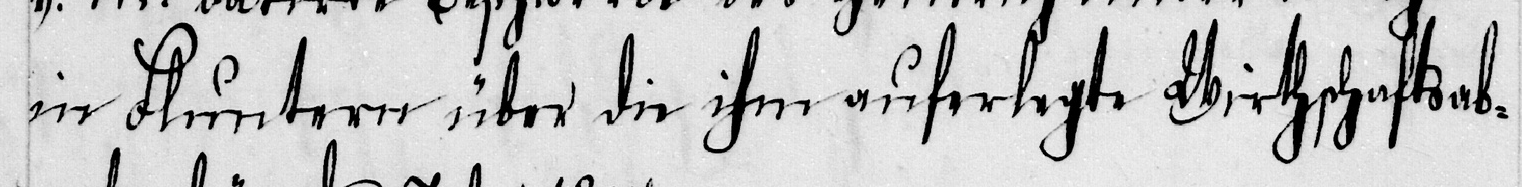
in Fluntern über die ihm auferlegte Wirtschaftsab¬
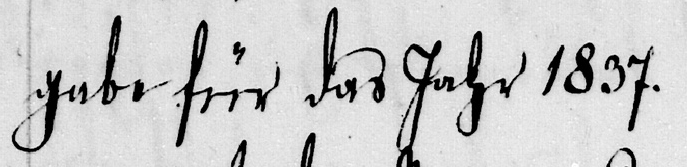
gabe für das Jahr 1837.
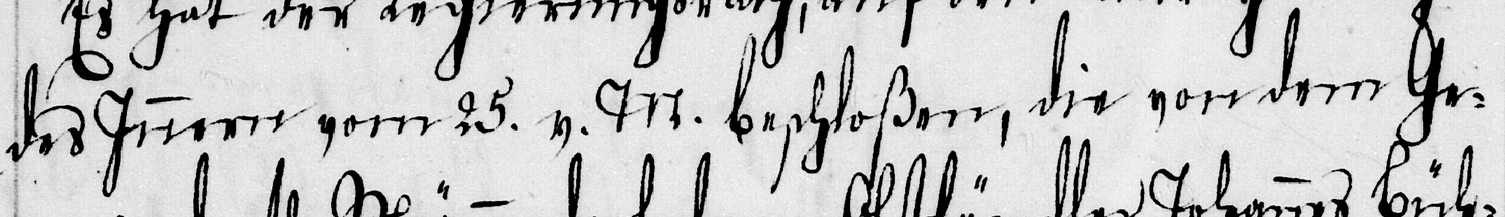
des Innern vom 25. v. M. beschloßen, die von dem Ge¬
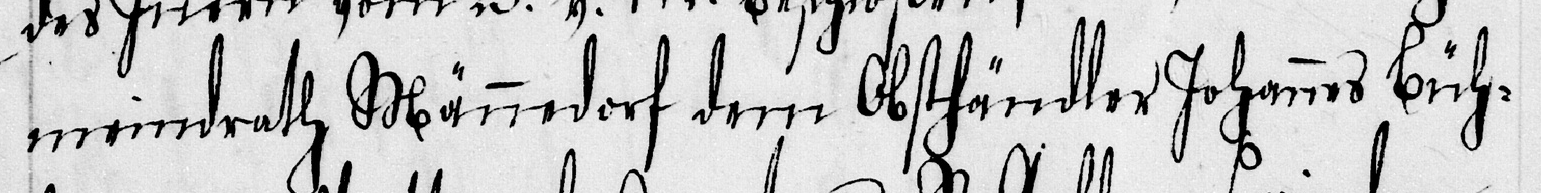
meindrath Männedorf dem Obsthändler Johannes Büch¬
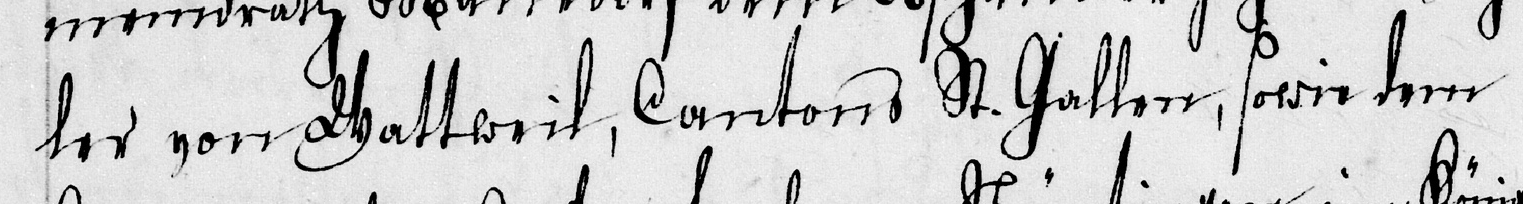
ler von Wattwil, Cantons St. Gallen, sowie dem
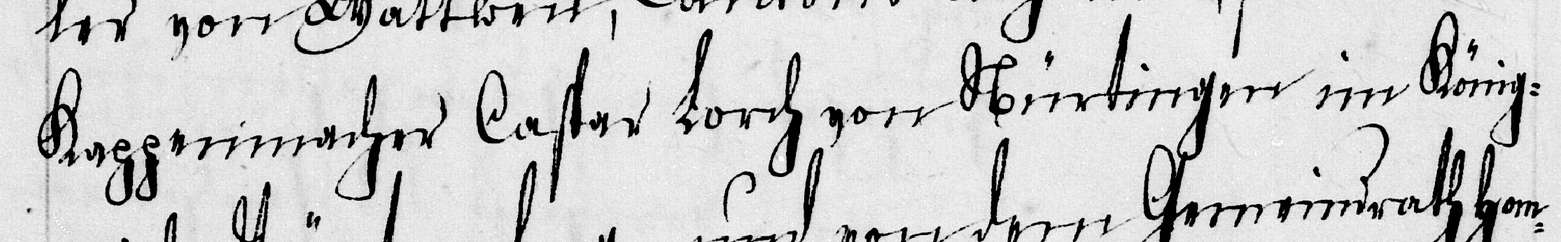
Rappenmacher Caspar Lorch von Nürtingen im König¬
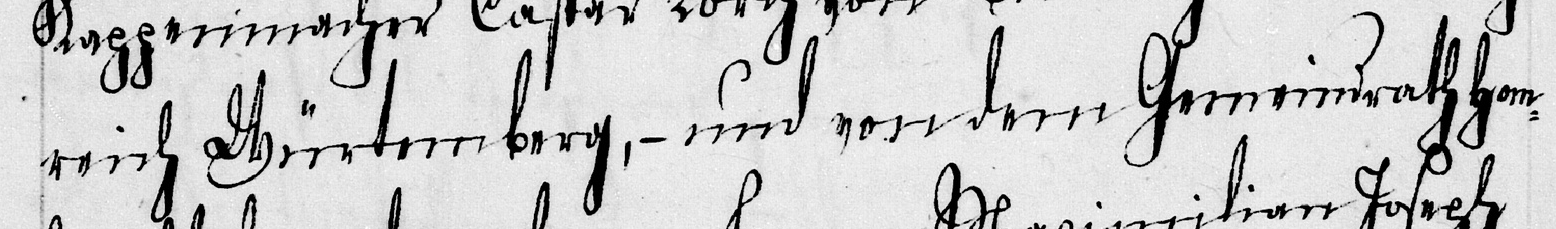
reich Würtemberg, – und von dem Gemeindrath Hom¬
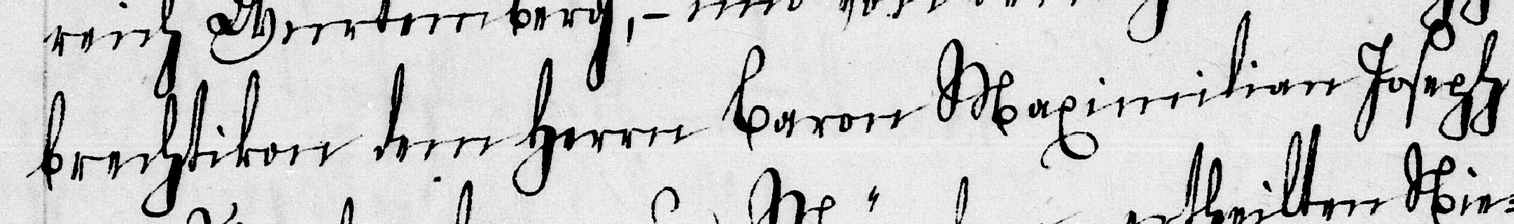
brechtikon dem Herrn Baron Maximilian Joseph
